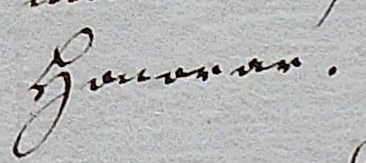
Honorar.
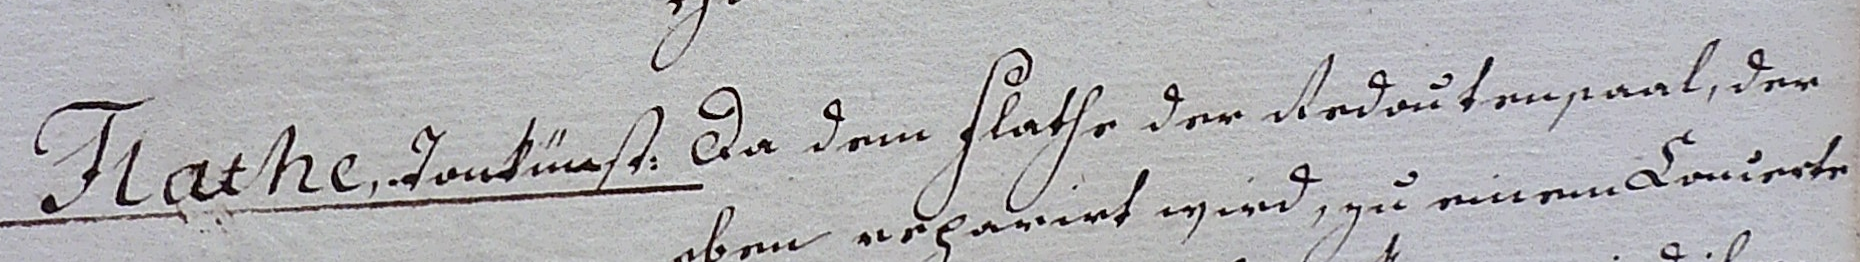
Flathe, Tonkünst: Da dem Flathe der Redoutensaal, der
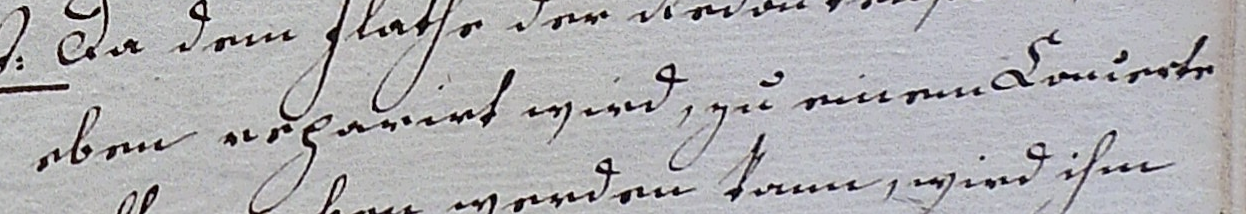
eben reparirt wird, zu einem Concerte
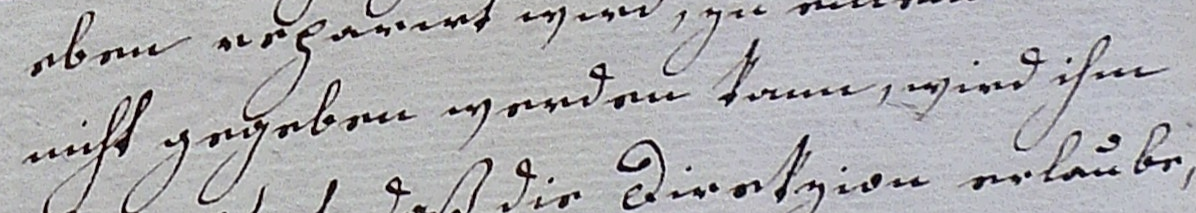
nicht gegeben werden kann, wird ihm
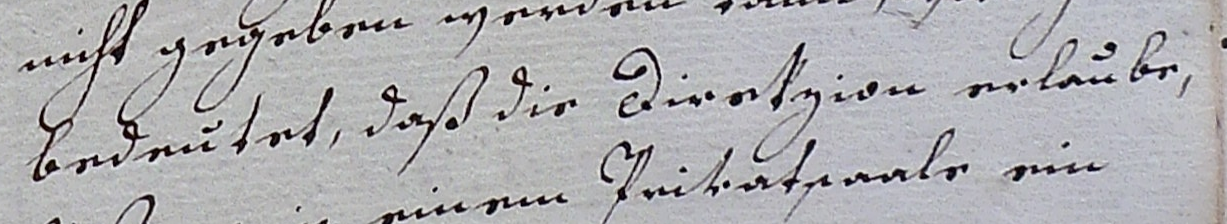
bedeutet, daß die Direkzion erlaube,
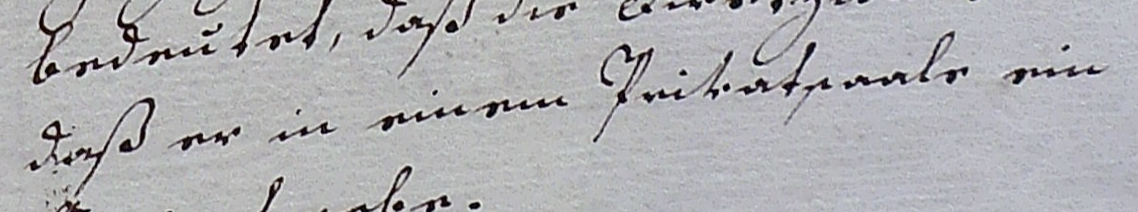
daß er in einem Pivatsaale ein
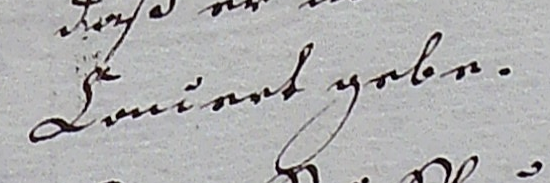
Concert gebe.
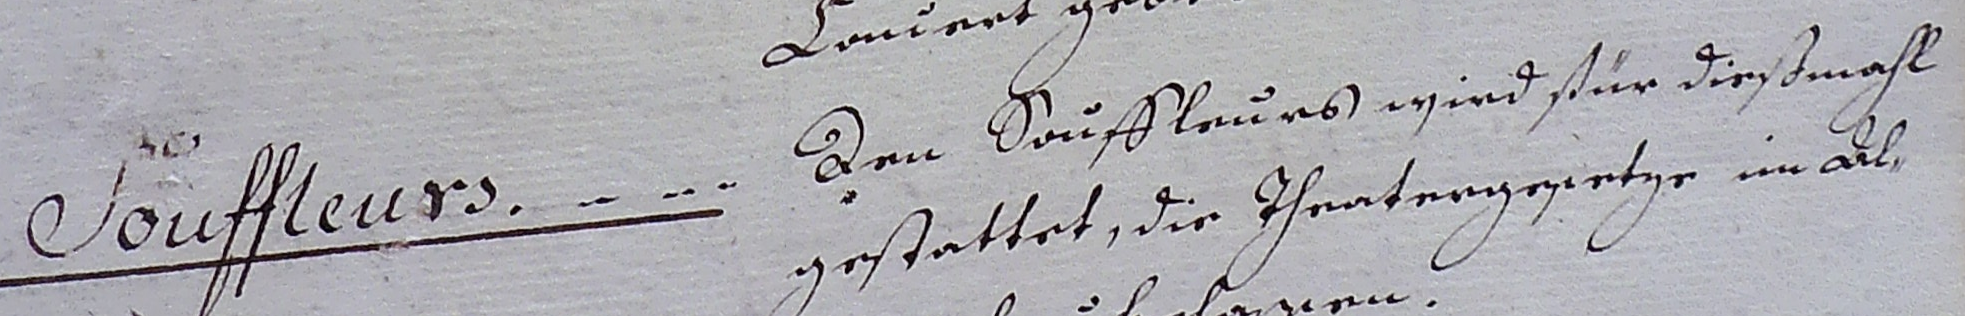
Souffleurs. .. .. . Den Souffleurs wird für dießmahl
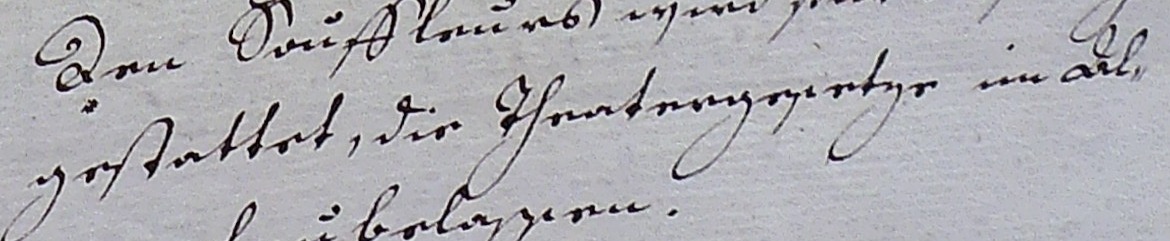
gestattet, die Theatergesetze im Al¬
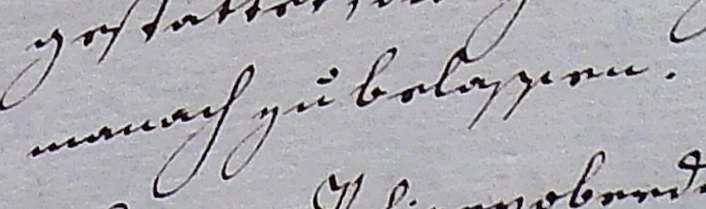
manach zubelassen.
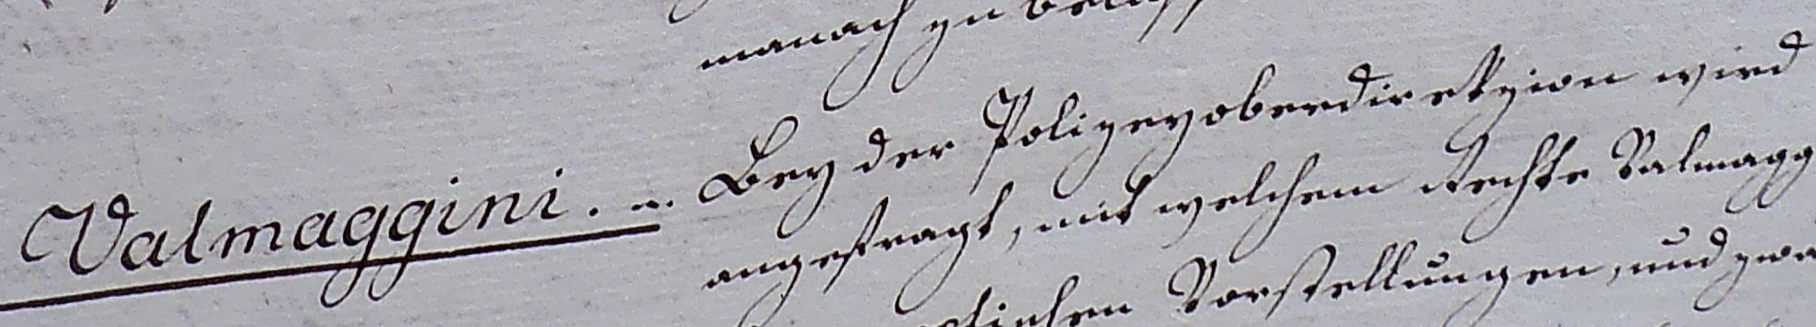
Valmaggini . ... Bey der Polizeyoberdirekzion wird
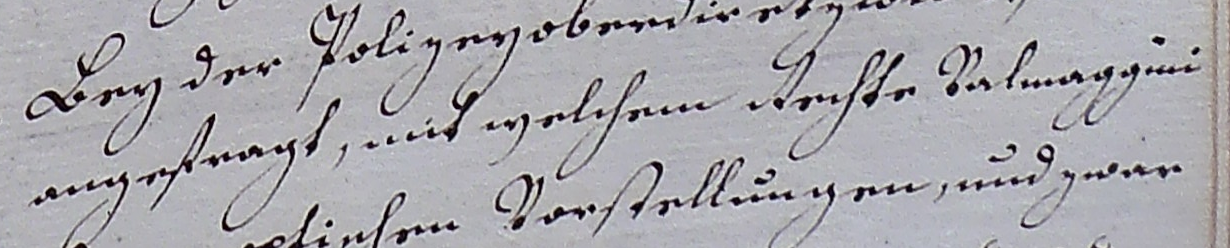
angefragt, mit welchem Rechte Valmaggini
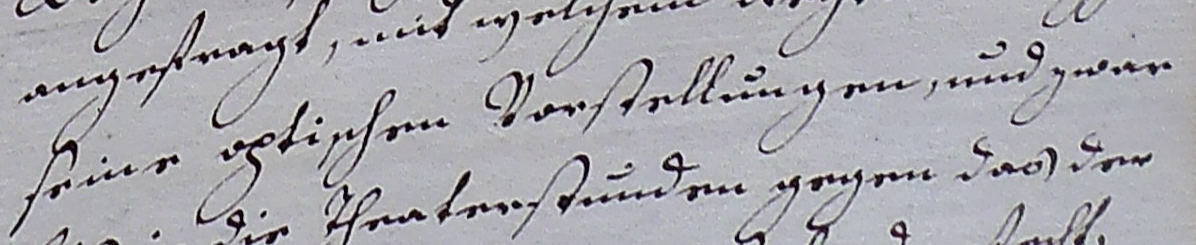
seine optischen Vorstellungen, und zwar
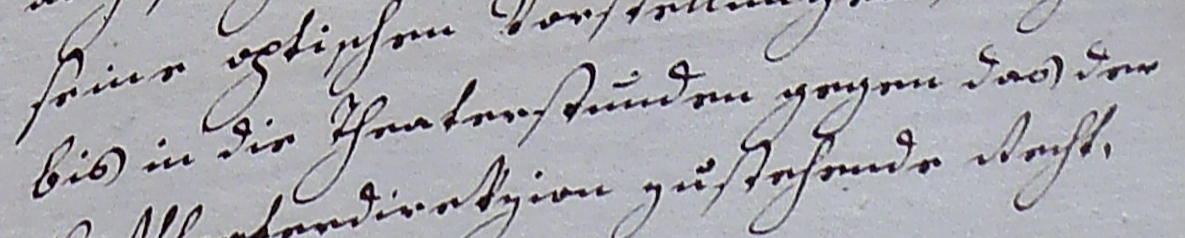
bis in die Theaterstunden gegen das der
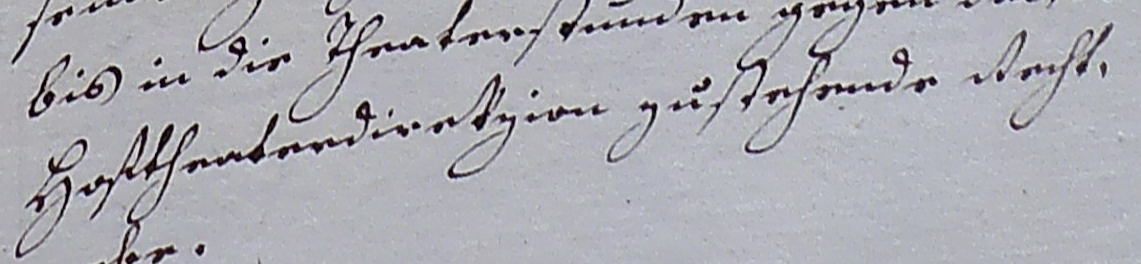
Hoftheaterdirekzion zustehende Recht,
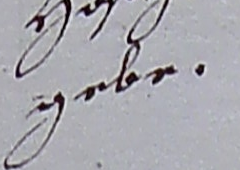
gebe.
